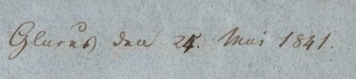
Glarus den 24. Mai 1841.
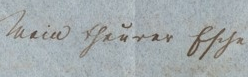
Mein theurer Escher!
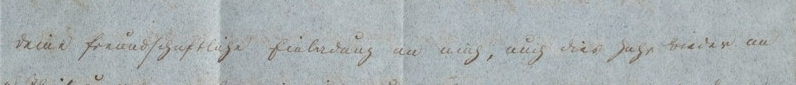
Deine freundschaftliche Einladung an mich, auch dies Jahr wieder an
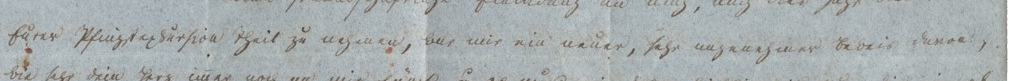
Eurer Pfingstexkursion Theil zu nehmen, war mir ein neuer, sehr angenehmer Beweis davon,
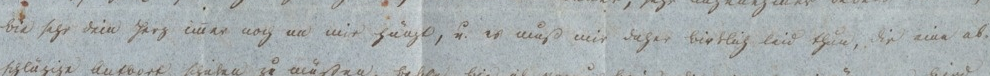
wie sehr dein Herz immer noch an mir hängt, u. es muß mir daher wirklich leid thun, dir eine ab-
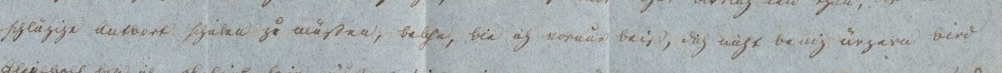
schlägige Antwort schicken zu müssen, welche, wie ich voraus weiß, dich nicht wenig ärgern wird.
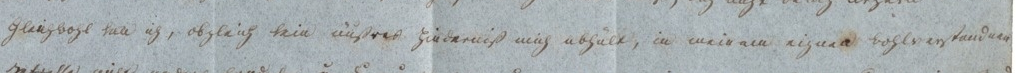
Gleichwohl kann ich, obgleich kein äußres Hinderniß mich abhält, in meinem eignen wohlverstandnen
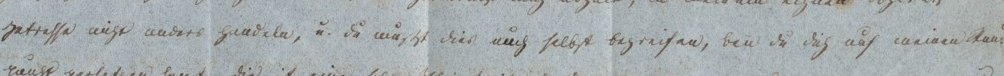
Intresse nicht anders handeln, u. du mußt dies auch selbst begreifen, wenn du dich auf meinen Stand-
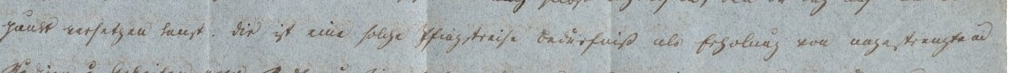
punkt versetzen kannst. Dir ist eine solche Pfingstreise Bedürfniß als Erholung von angestrengten
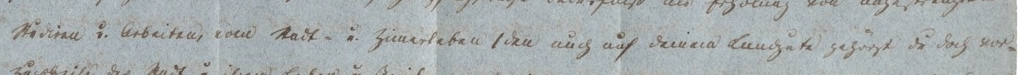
Studien u. Arbeiten, vom Stadt- und Zimmerleben (denn auch auf deinem Landgute gehörst du doch vor-
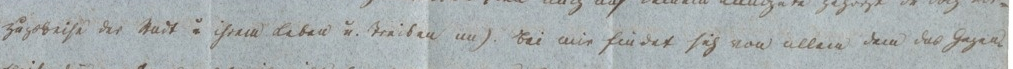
zugsweise der Stadt u. ihrem Leben u. Treiben an). Bei mir findet sich von allem dem das Gegen-
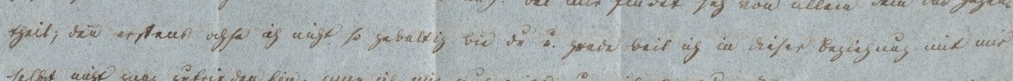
theil; denn erstens ochse ich nicht so gewaltig wie du u. grade weil ich in dieser Beziehung mit mir
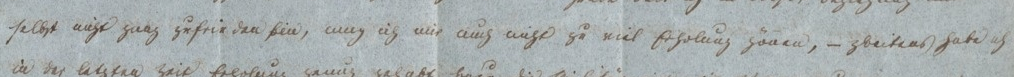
selbst nicht ganz zufrieden bin, mag ich mir auch nicht zu viel Erholung gönnen, – zweitens habe ich
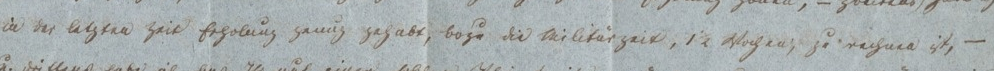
in der letzten Zeit Erholung genug gehabt, wozu die Militärzeit, 1½ Wochen, zu rechnen ist, –
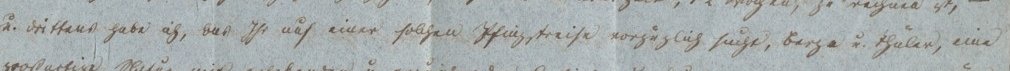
u. drittens habe ich, was Ihr auf einer solchen Pfingstreise vorzüglich sucht, Berge u. Thäler, eine
